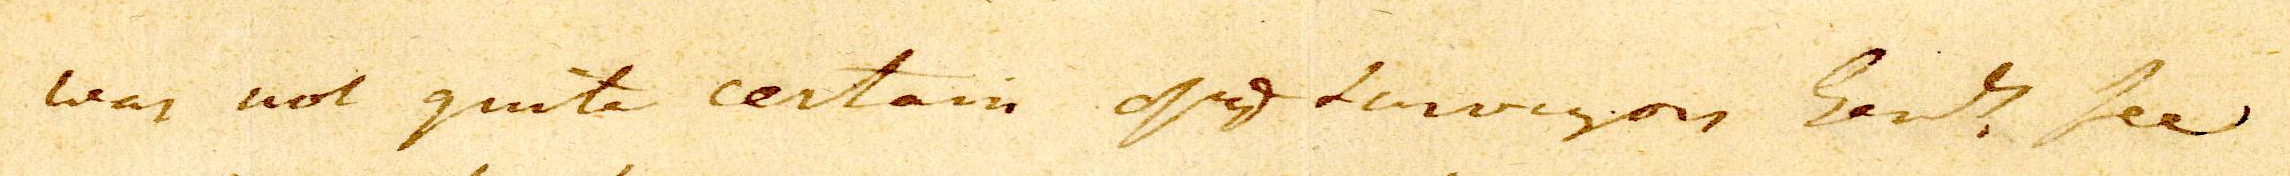was not quite certain of y^e surgeon Gen^l. Lee
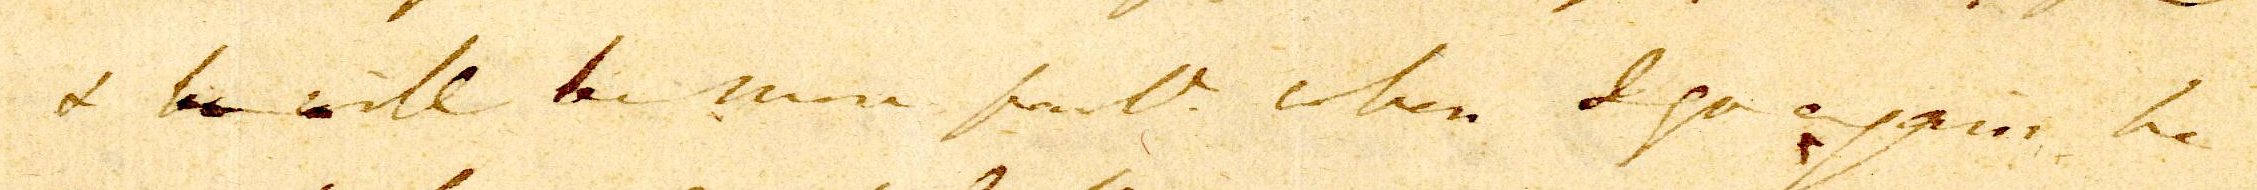& he will be more fonl^e when I go again he
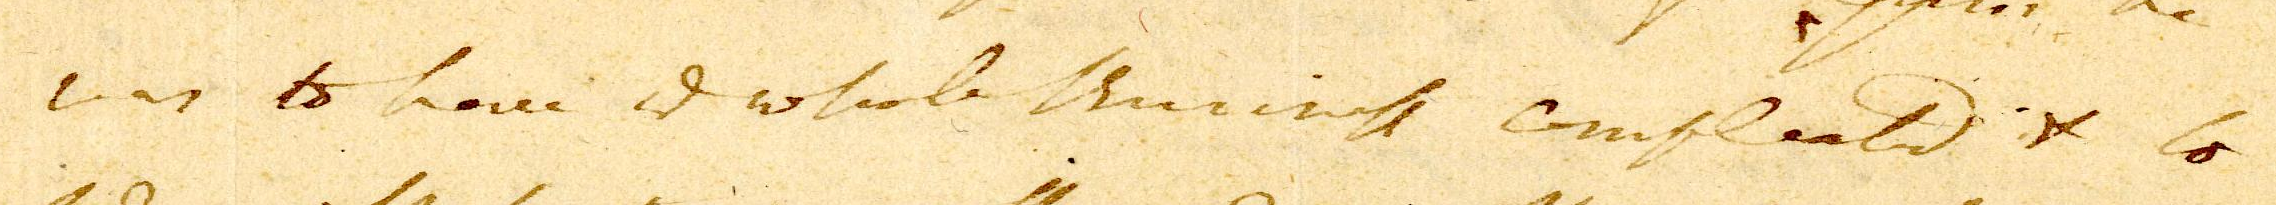was to have y^e whole Business compleated it to
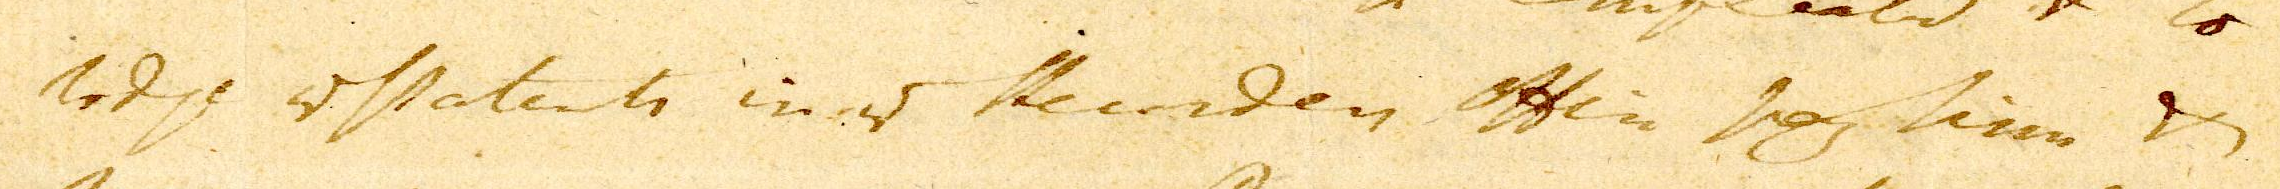lodge y^e patents in y^e Hearders Office pay him &
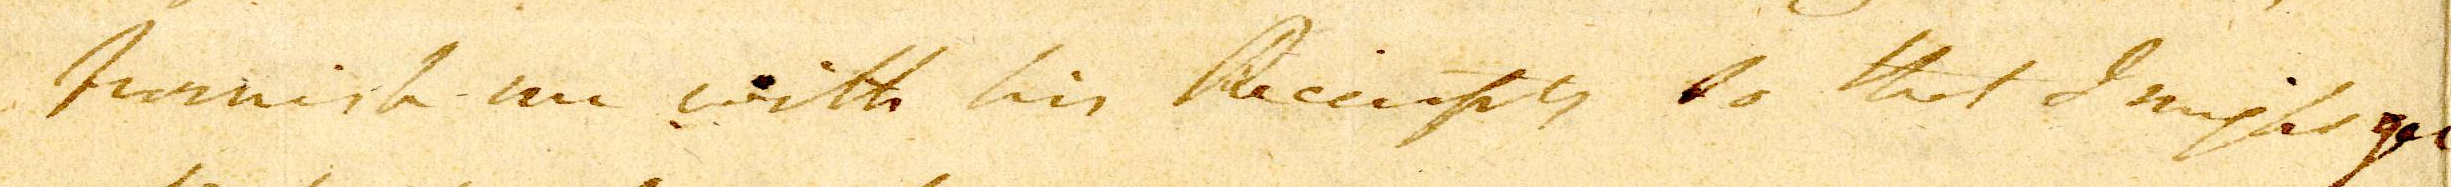furnish me with his Receipts so that I might get
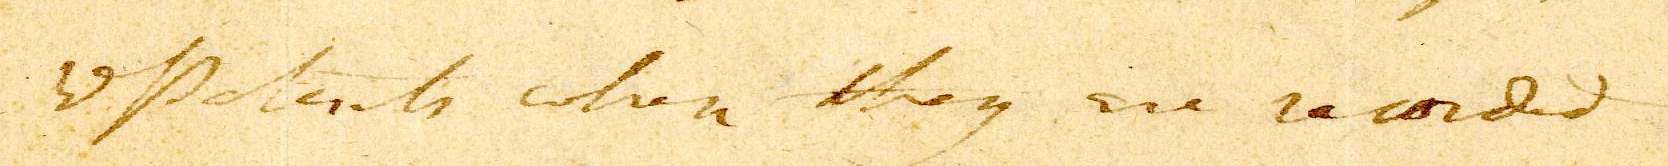y^e patents when they are recorded
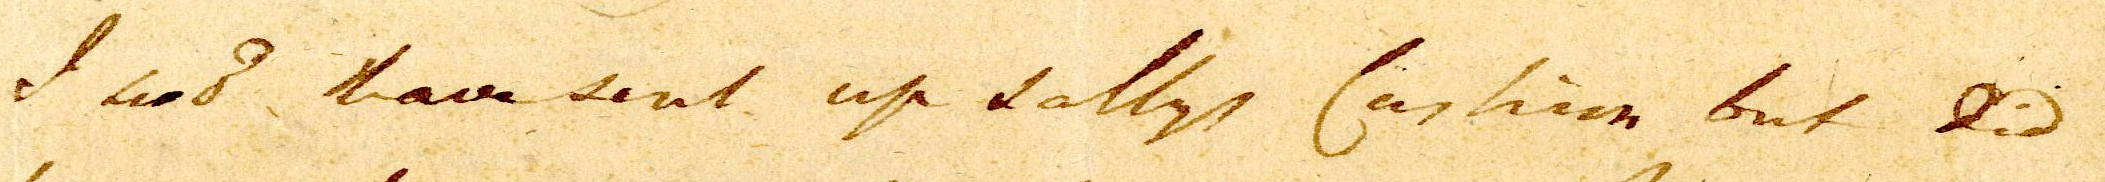I led have sent up Sallys Cushion but did
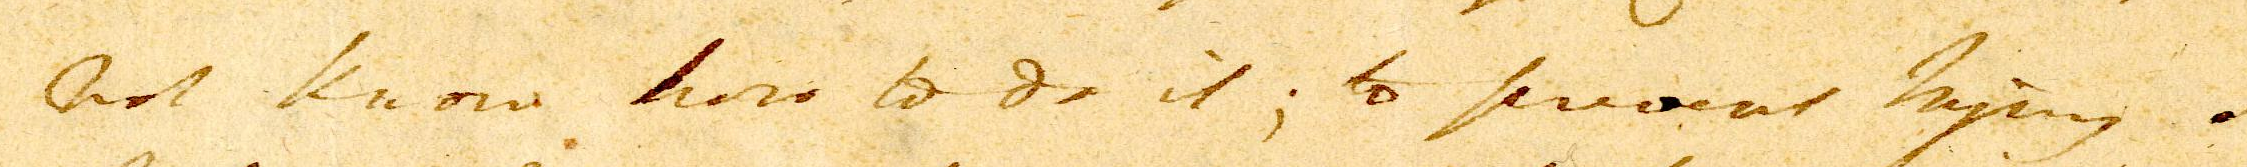not know hers to do it to prevent Nying
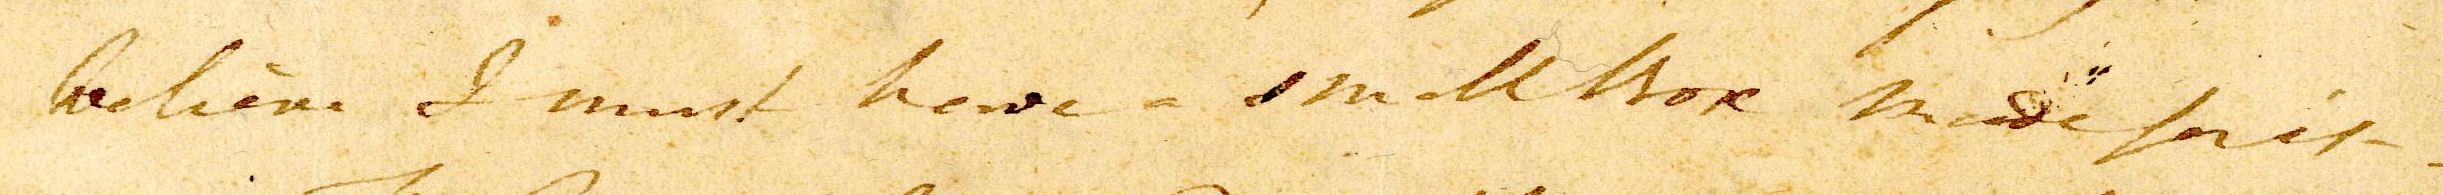believe I must have a small box made for it
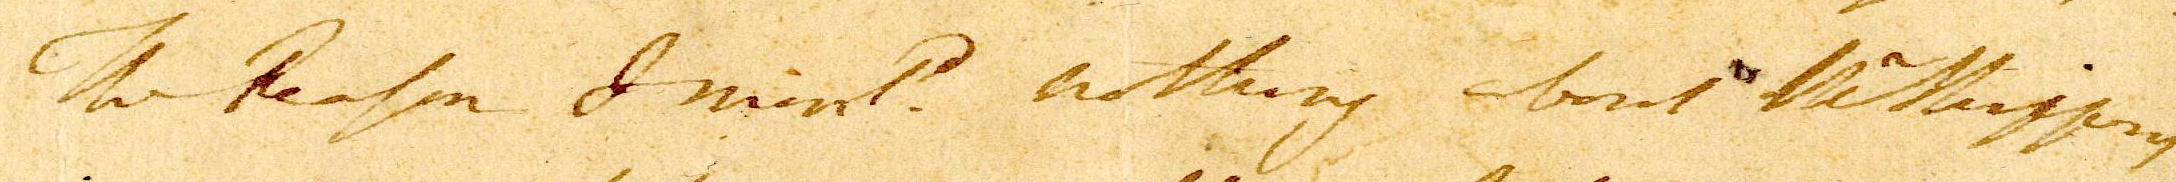The Reason I ment^d. nothing about the Necessary
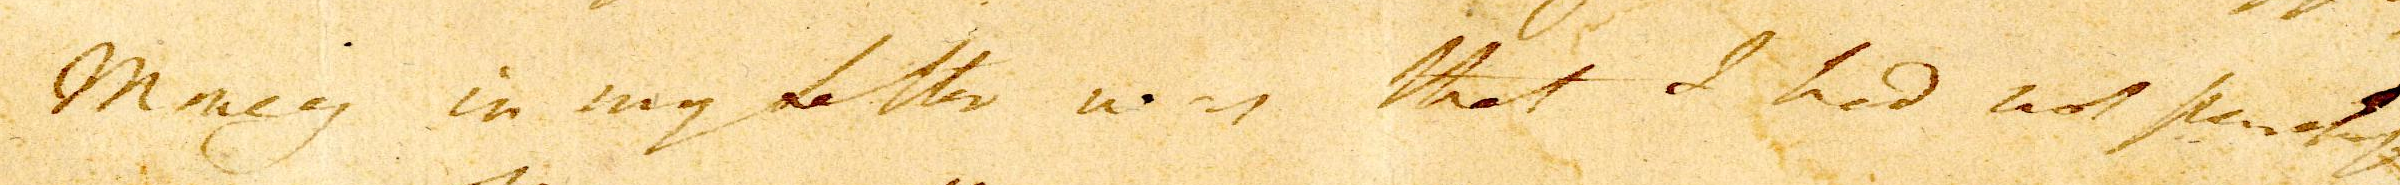Money in my Letter was that I had not penalty for
